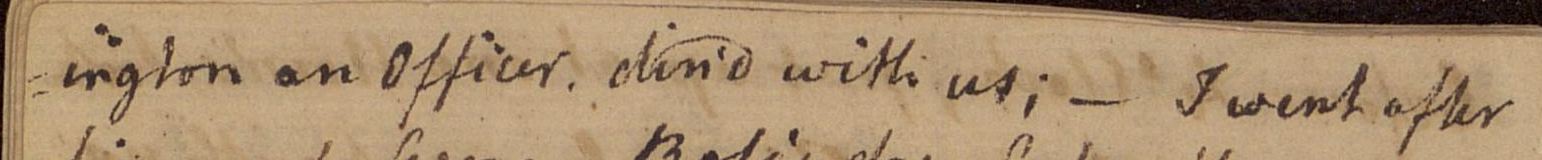-ington an Officer, din'd with us;- I went after
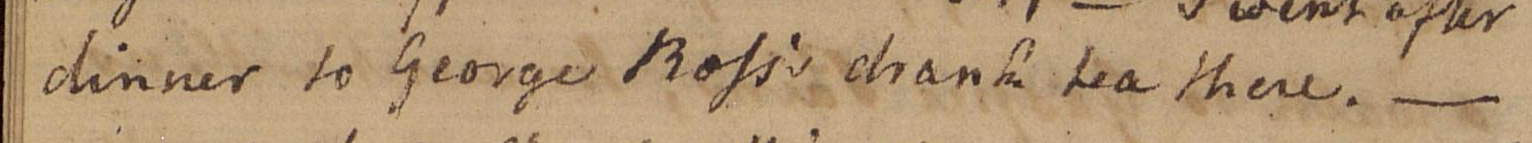dinner to George Ross's drank tea there.-
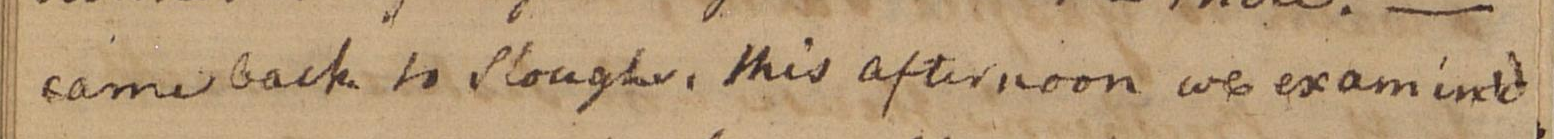came back to Sloughs, this afternoon we examin'd
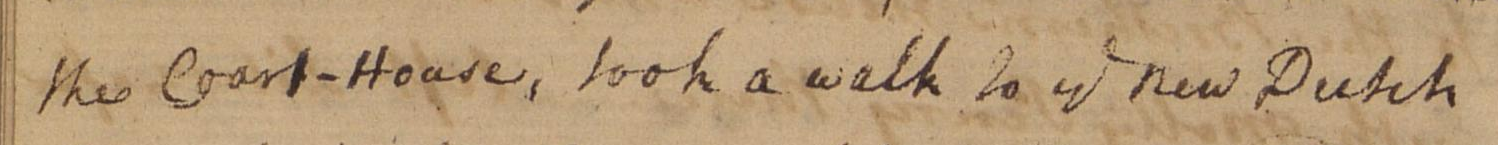the Coart-House, took a walk to y^e new Dutch
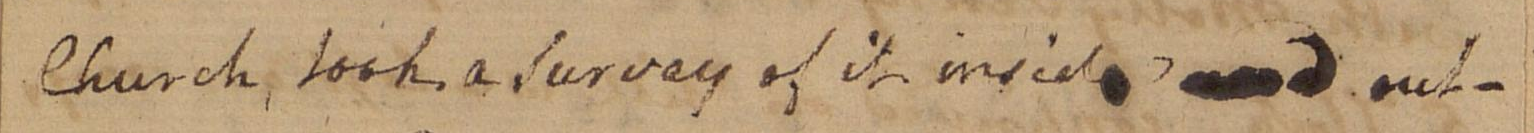Church took, a survey of it inside and out-
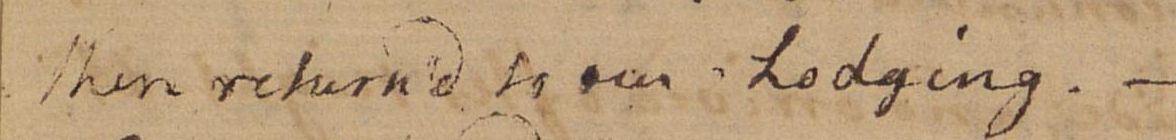then return'd to our Lodging.-
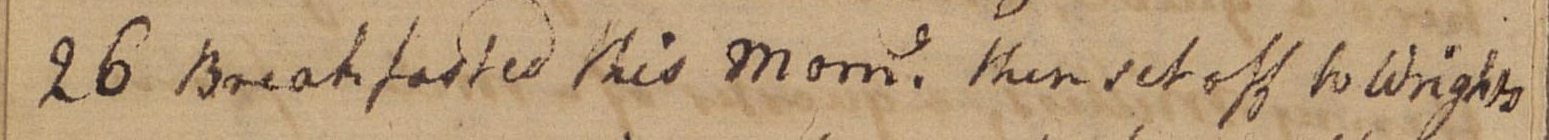26 Breakfasted this Morn^g. then set off to Wrights
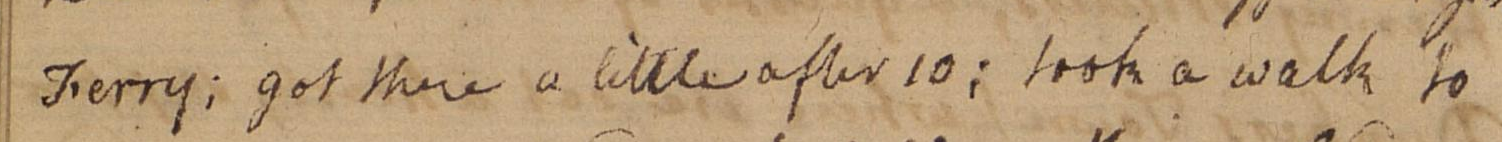Ferry; got there a little after 10; took a walk to
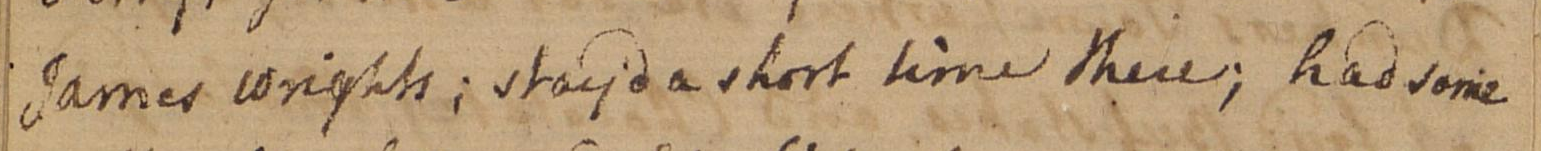James Wrights; stay'd a short time there; had some
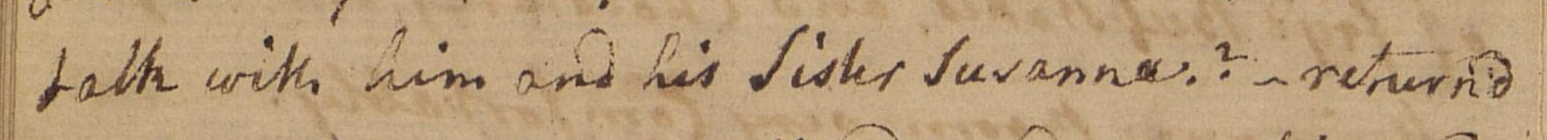talk with him and his Sister Susanna.^s.- return'd
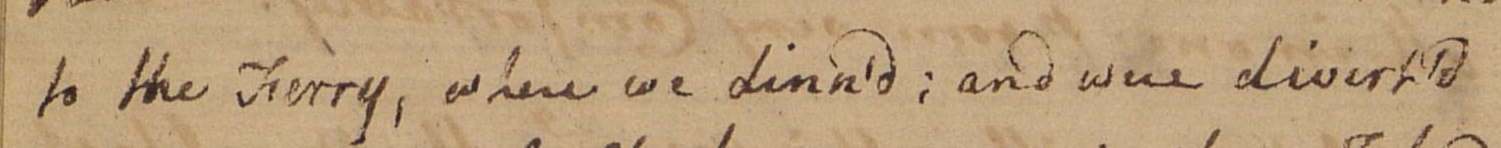to the Ferry, where we dinn'd; and were divert'd
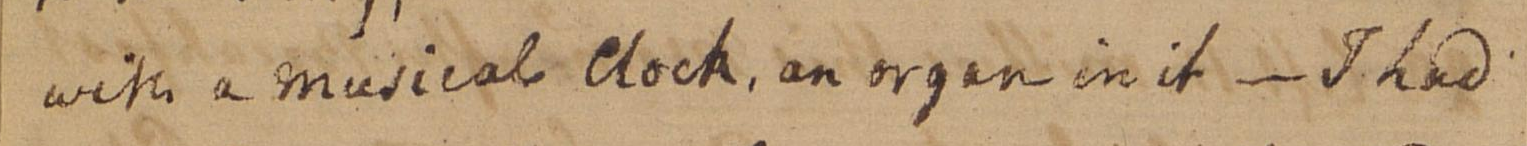with a Musical Clock, an organ in it- I had
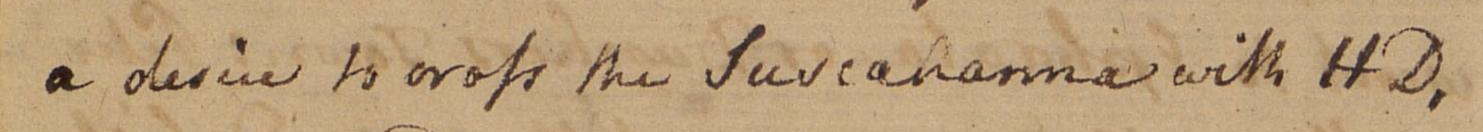a desire to cross the Suscahanna with HD.
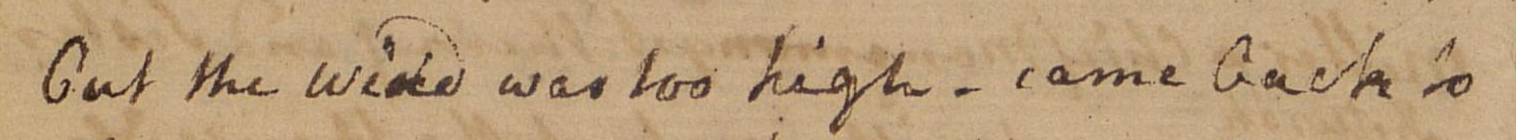but the widd was too high- came back to
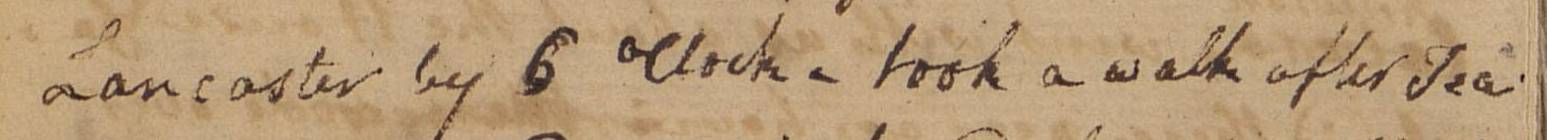Lancaster by 6 ^oClock- took a walk afer Tea
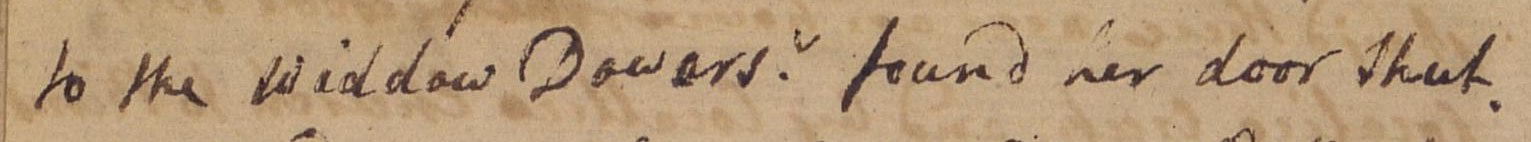to the Widdow Dowars^s. found her door Shut
